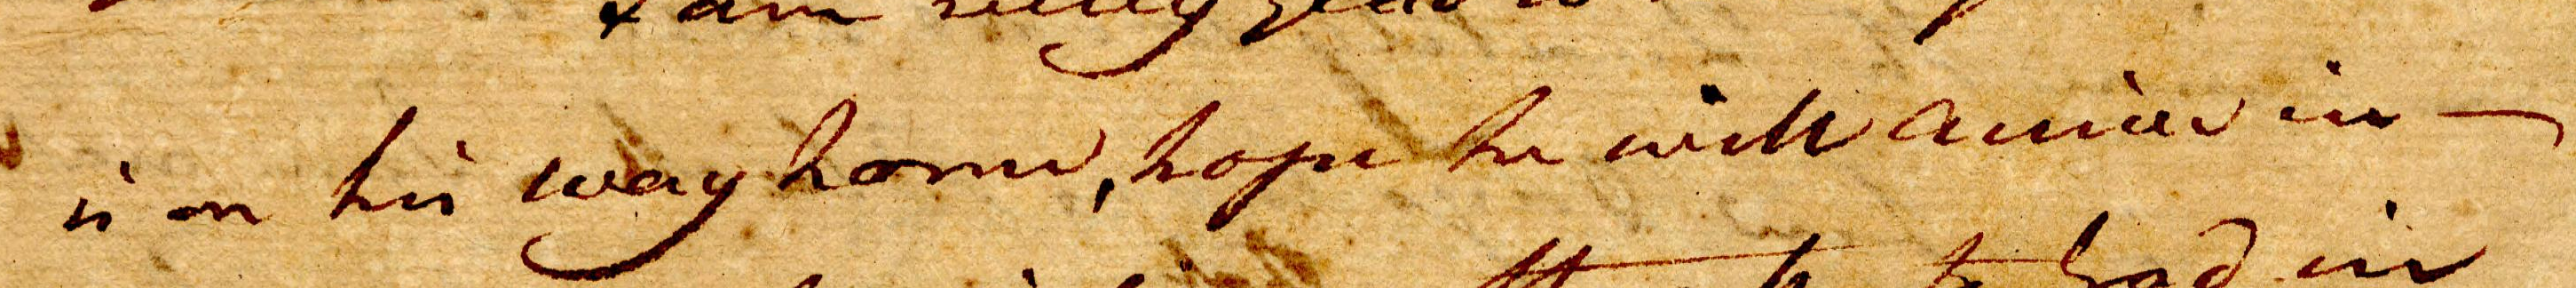is on his way home, hope he will Arrive in-
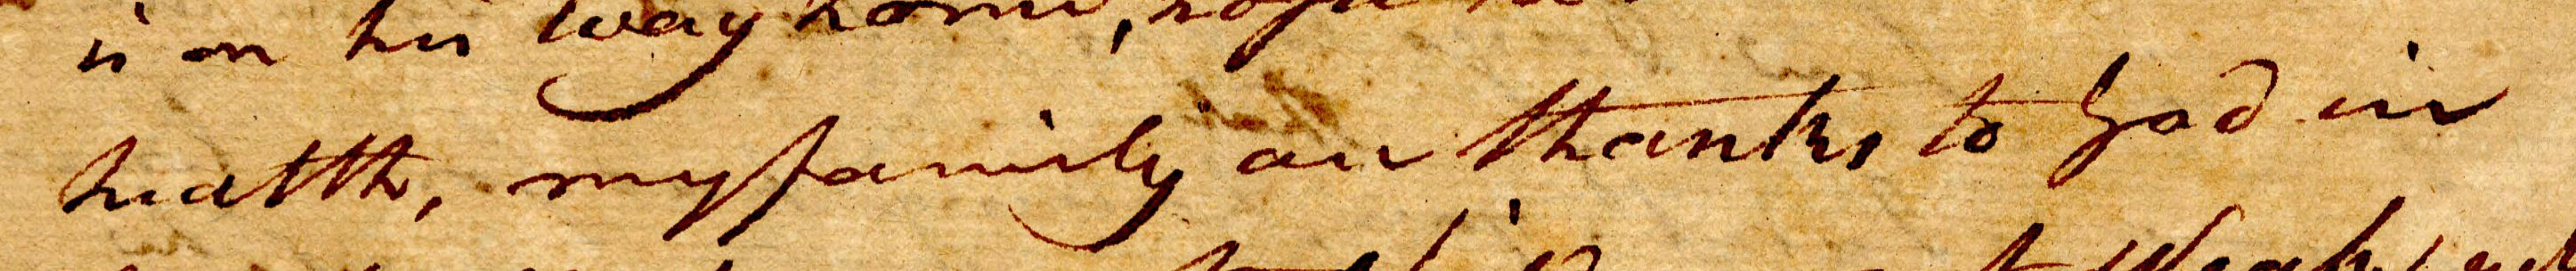health, my family are thanks to God in
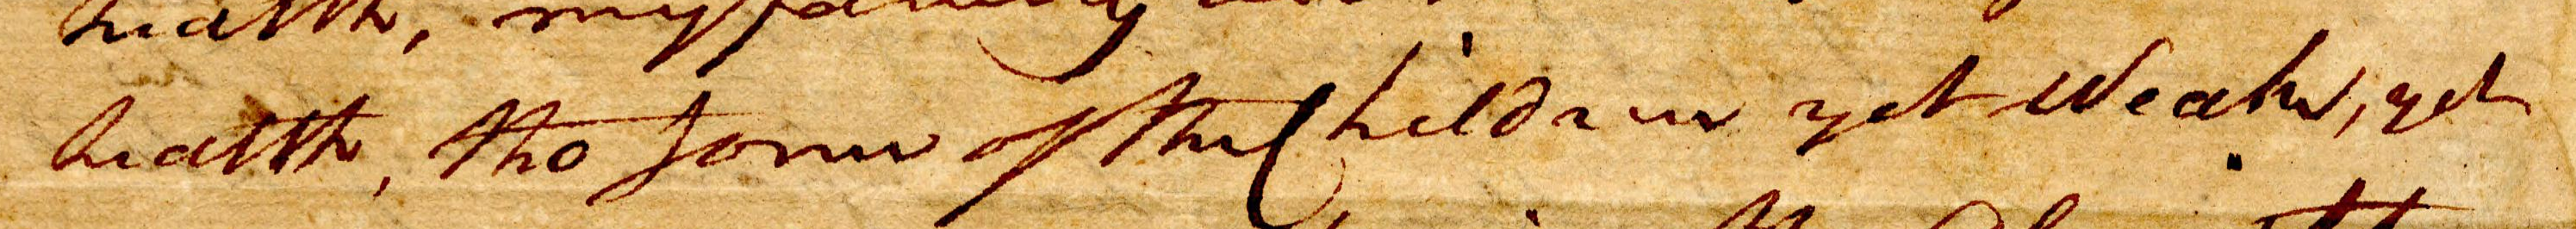health, tho some of the Children yet Weak, yet
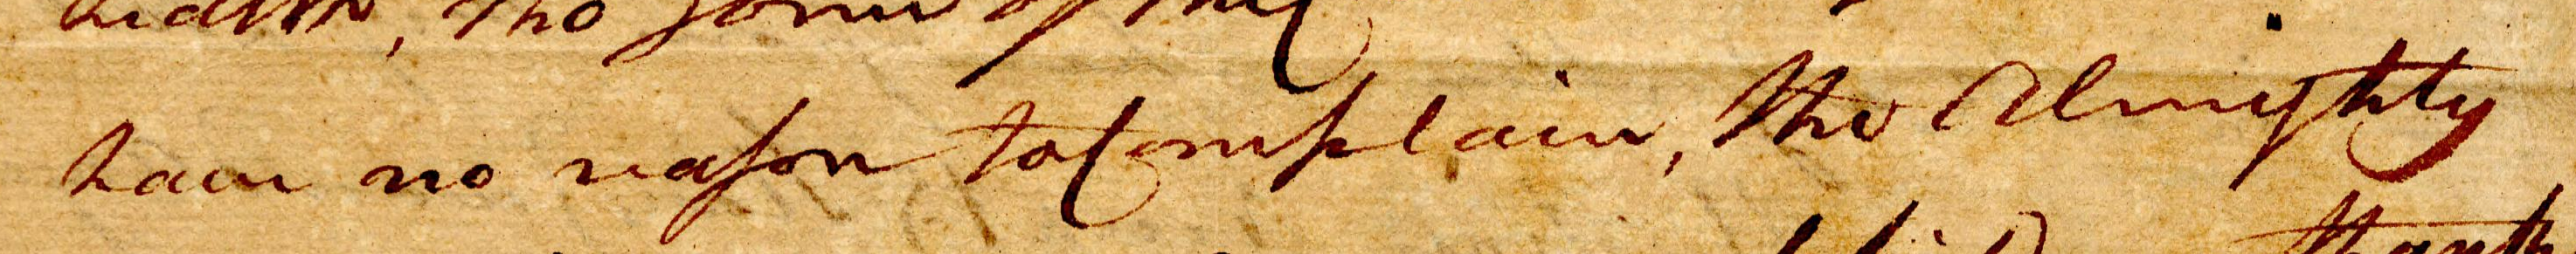have no reason to Complain, the Almighty
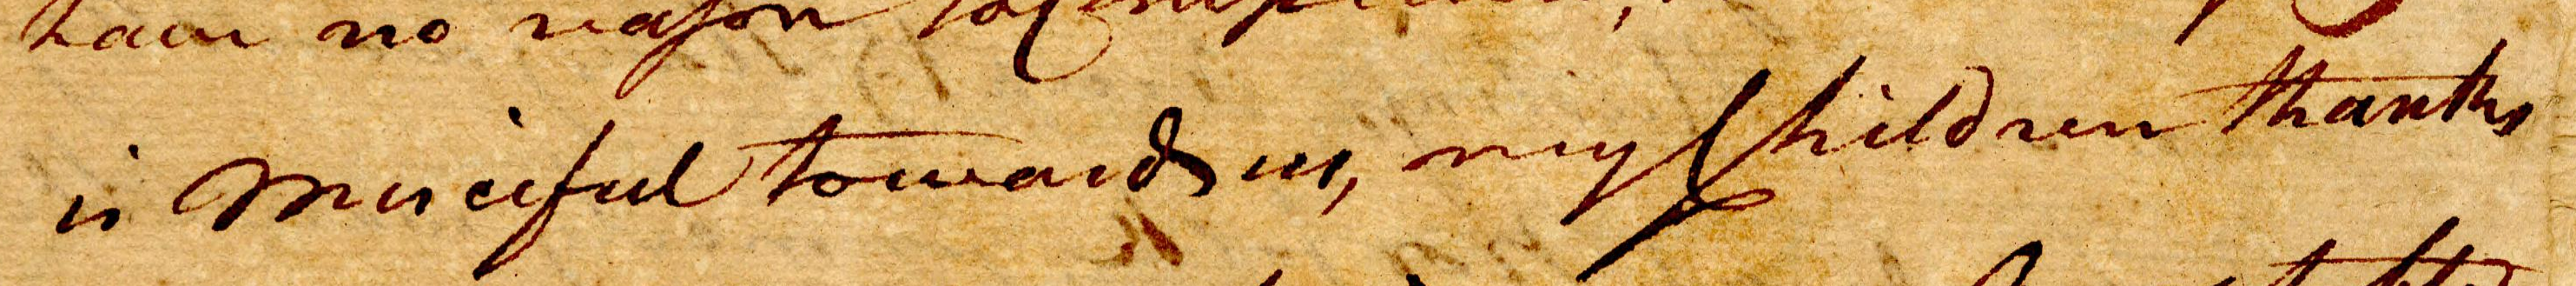is merciful towards us, my Children thanks
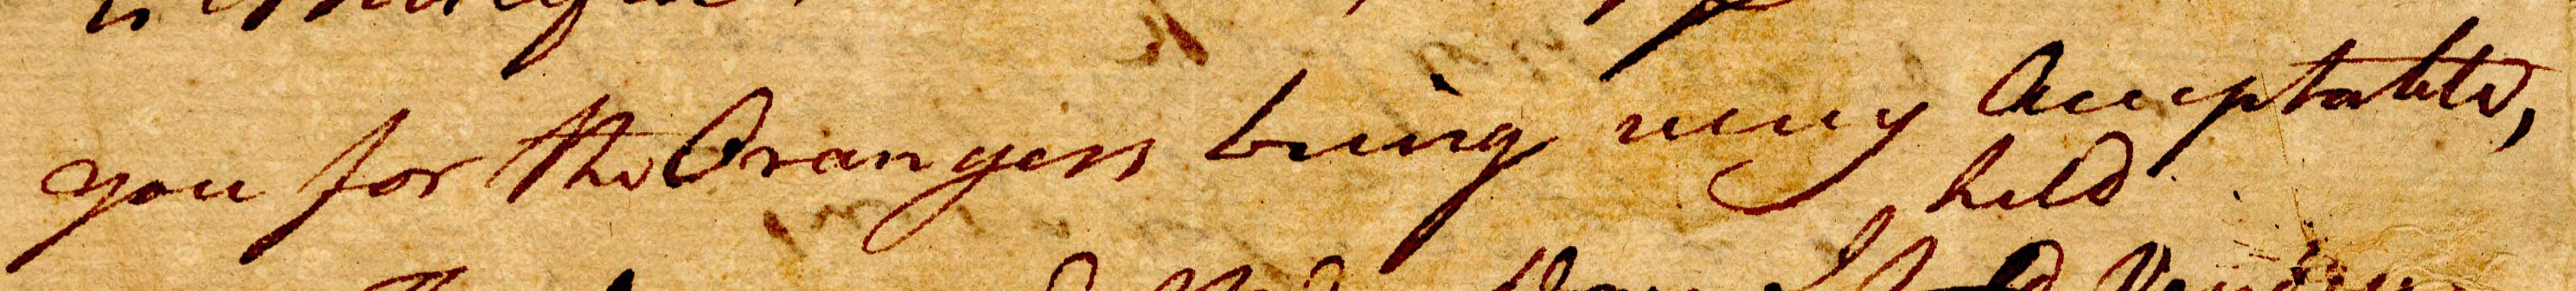you for the Oranges being very Acceptable,
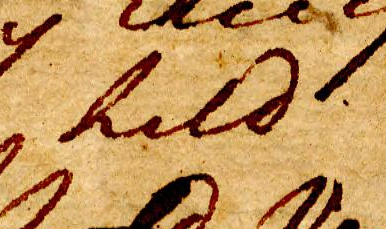held
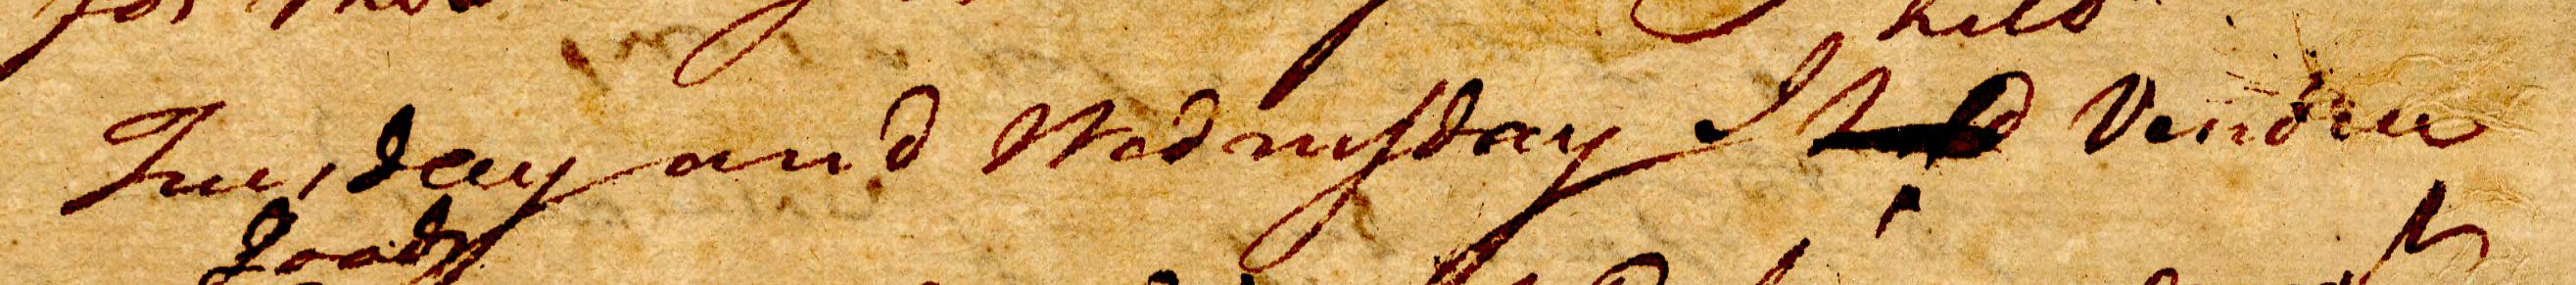Tuesday and wednesday I [____] ^ Vendue
